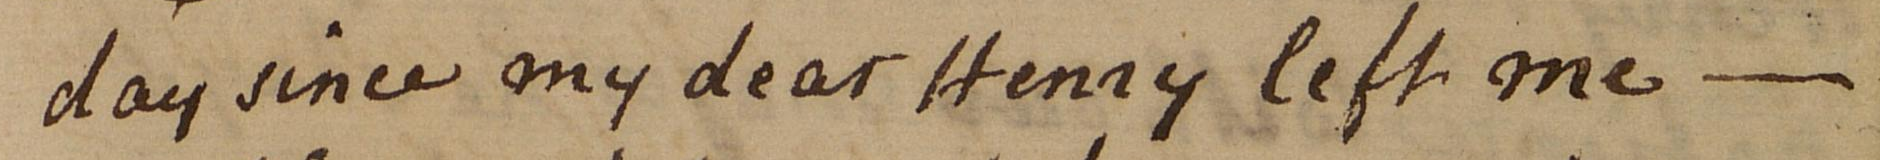day since my dear Henry left me-
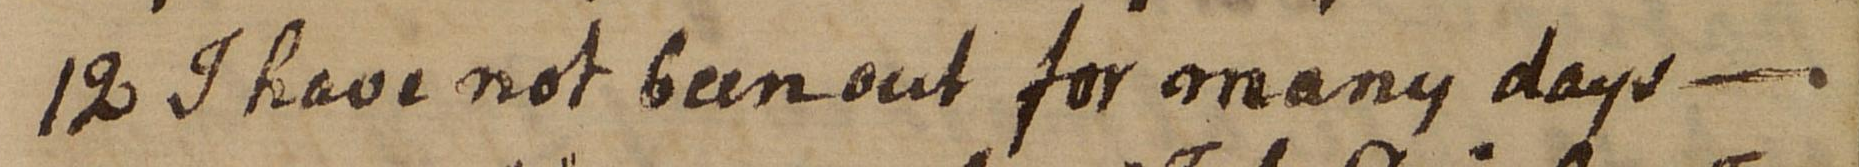12 I have not been out for many days-
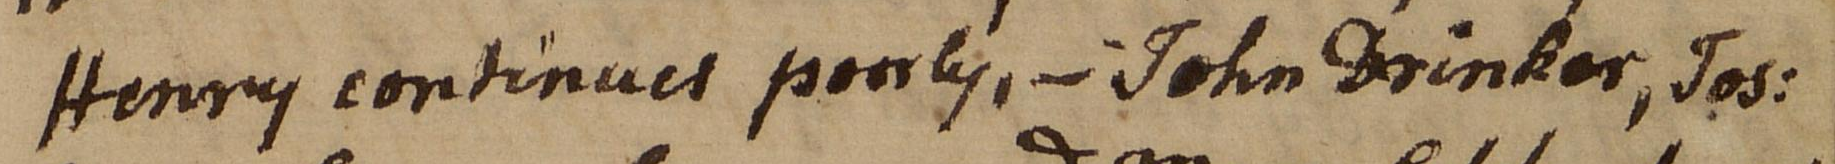Henry continues poorly,- John Drinker, Jos:
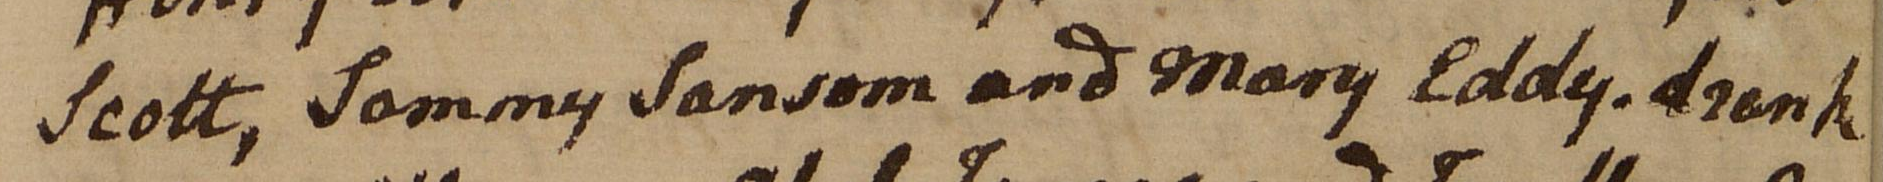Scott, Sammy Sansom and Mary Eddy. drank
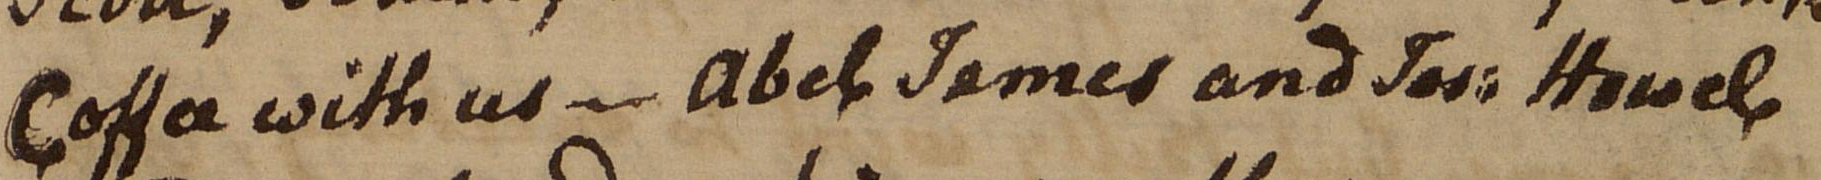Coffee with us- Abel James and Jos: Howel
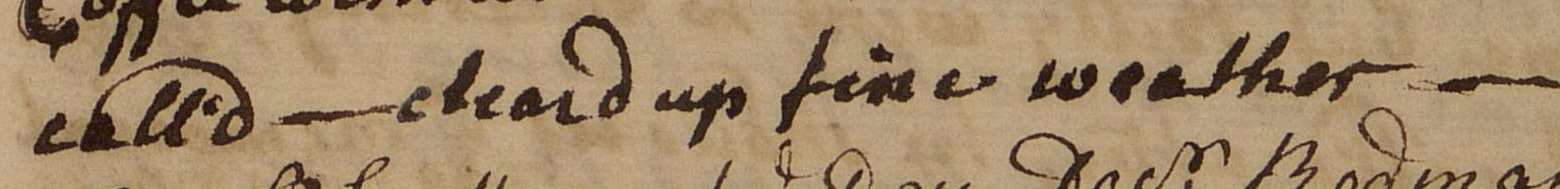call'd- cleard up fine weather-
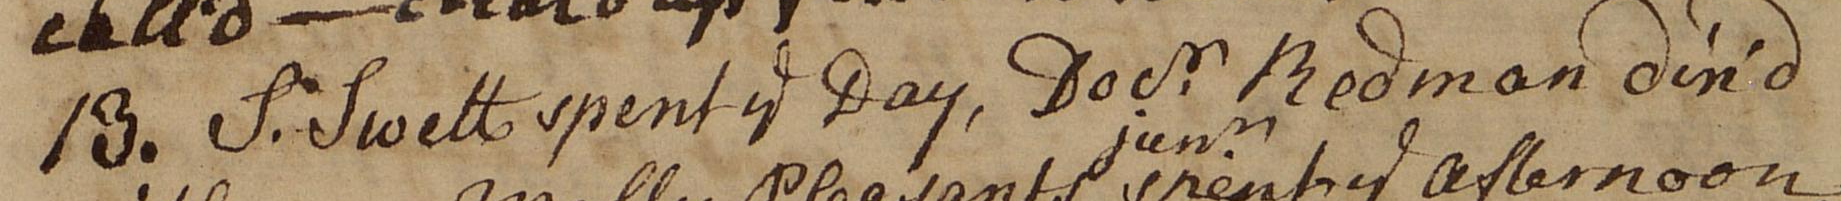13. S. Swett spent y^e Day, Doc^r. Redman din'd
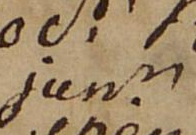jun^r.
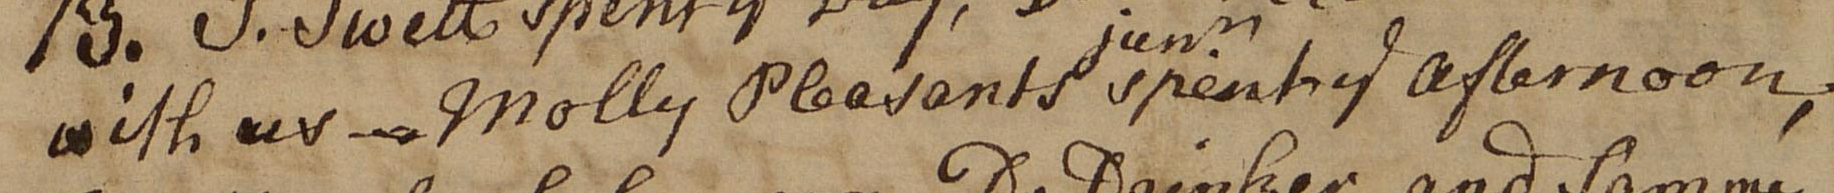with us- Molly Pleasants spent y^e Afternoon,
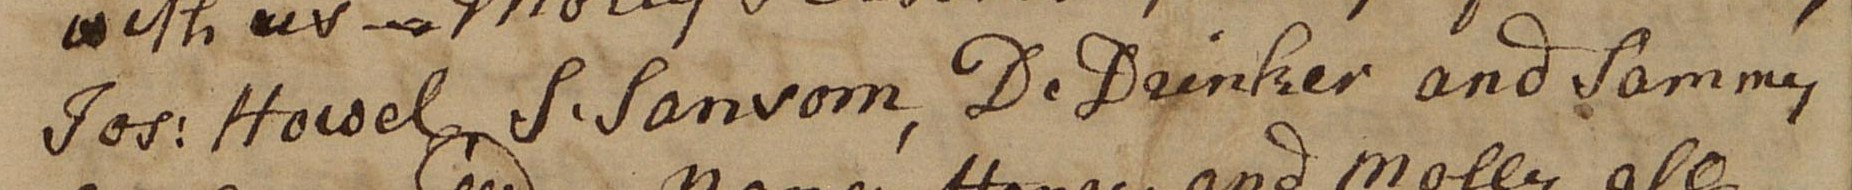Jos: Howel, S. Sansom, D. Drinker and Sammy
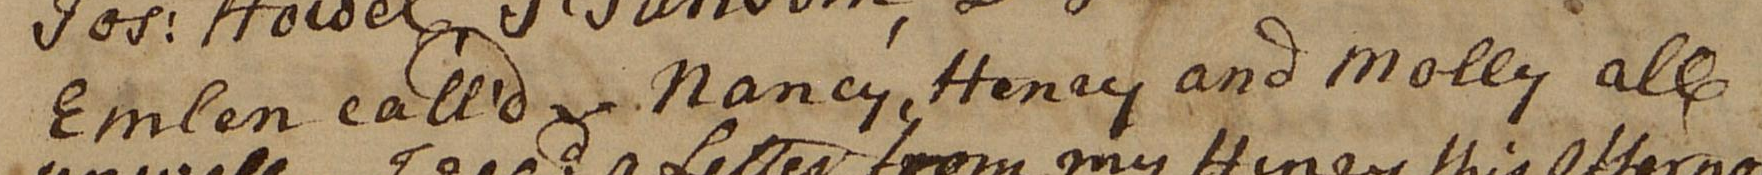Emlen call'd- Nancy, Henry and Molly all
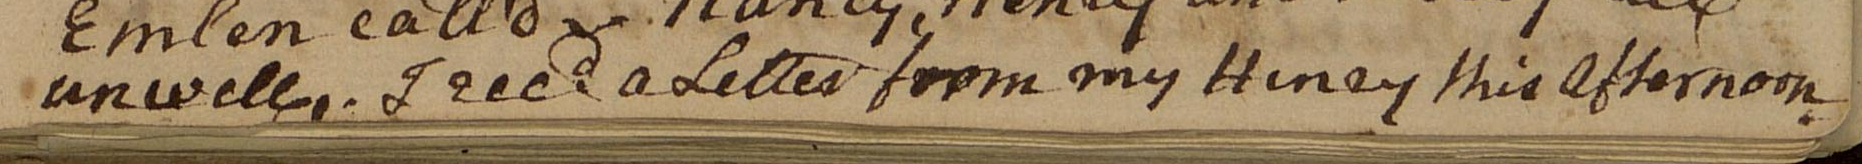unwell. I rec^d. a Letter from my Henry this Afternoon
